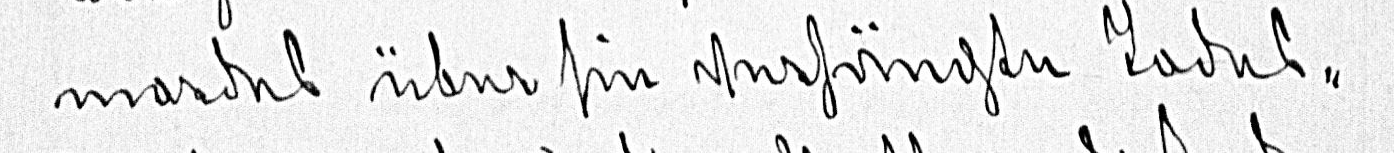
mordes über sie verhängte Todes¬
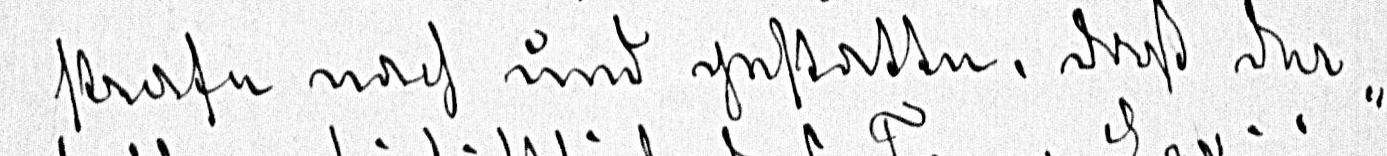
strafe nach und gestatte, daß der¬
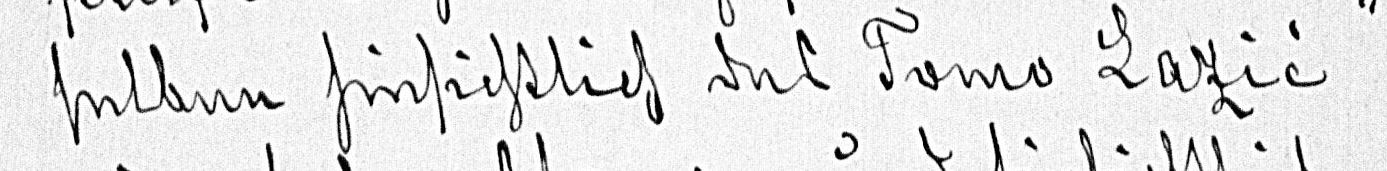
selben hinsichtlich des Tomo Lazić
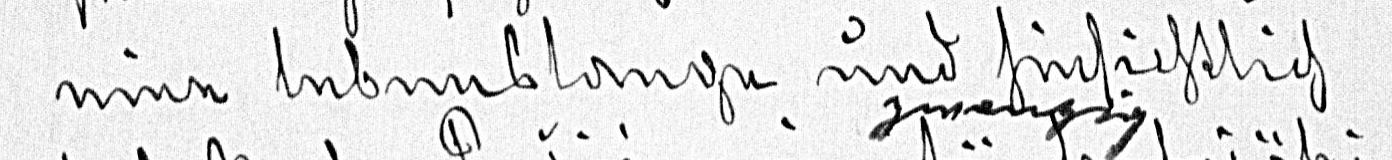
eine lebenslange und hinsichtlich
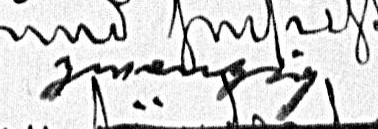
zwanzig
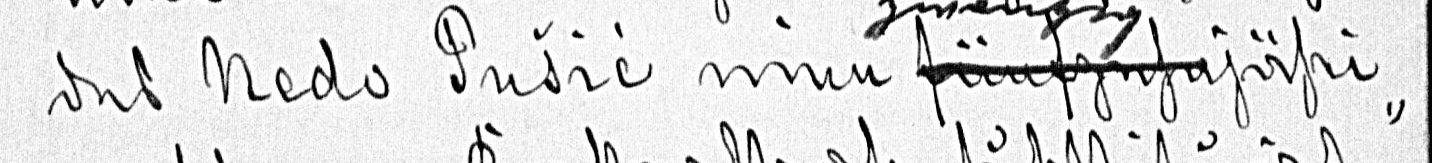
des Nedo Pusić eine jähri¬
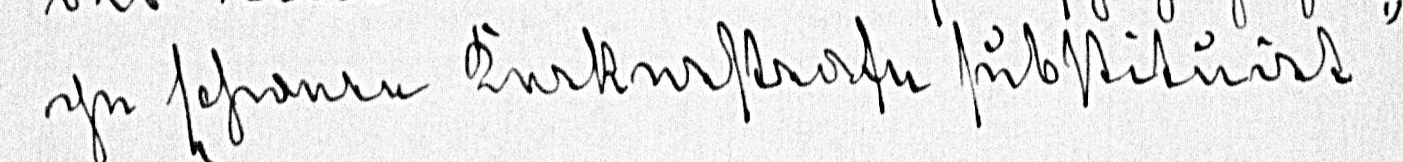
ge schwere Kerkerstrafe substituirt
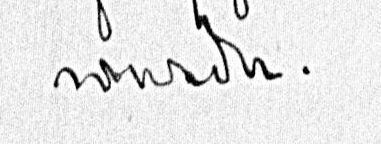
werde.
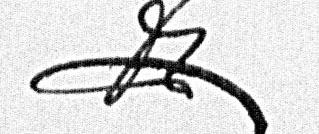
xx
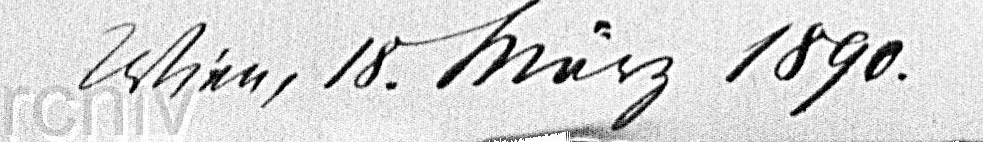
Wien, 18. März 1890.
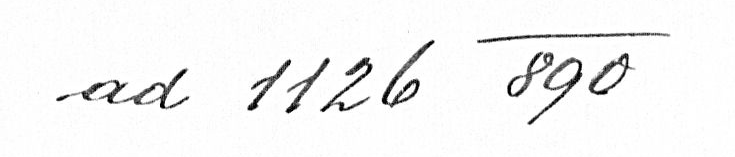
ad 1126 890
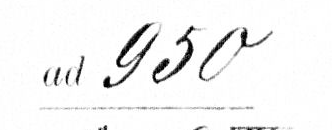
ad 950
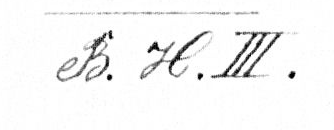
B. H. III
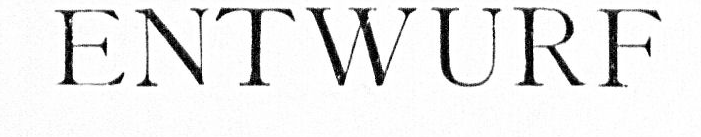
ENTWURF
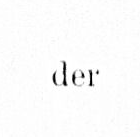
der
